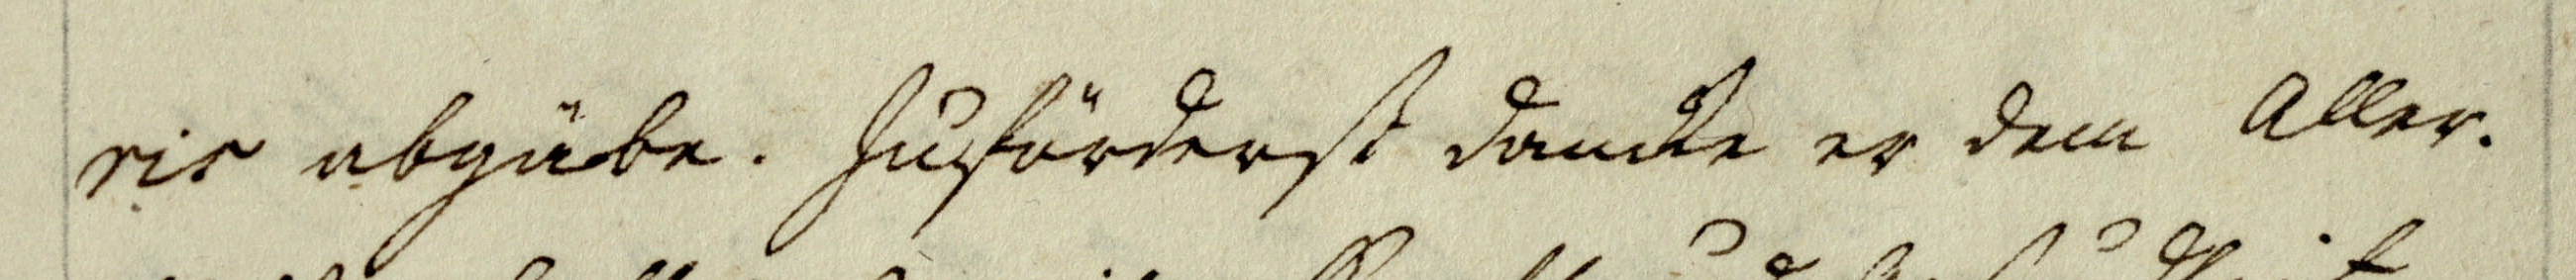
ris abgäbe. Zuförderst dancke er dem Aller¬
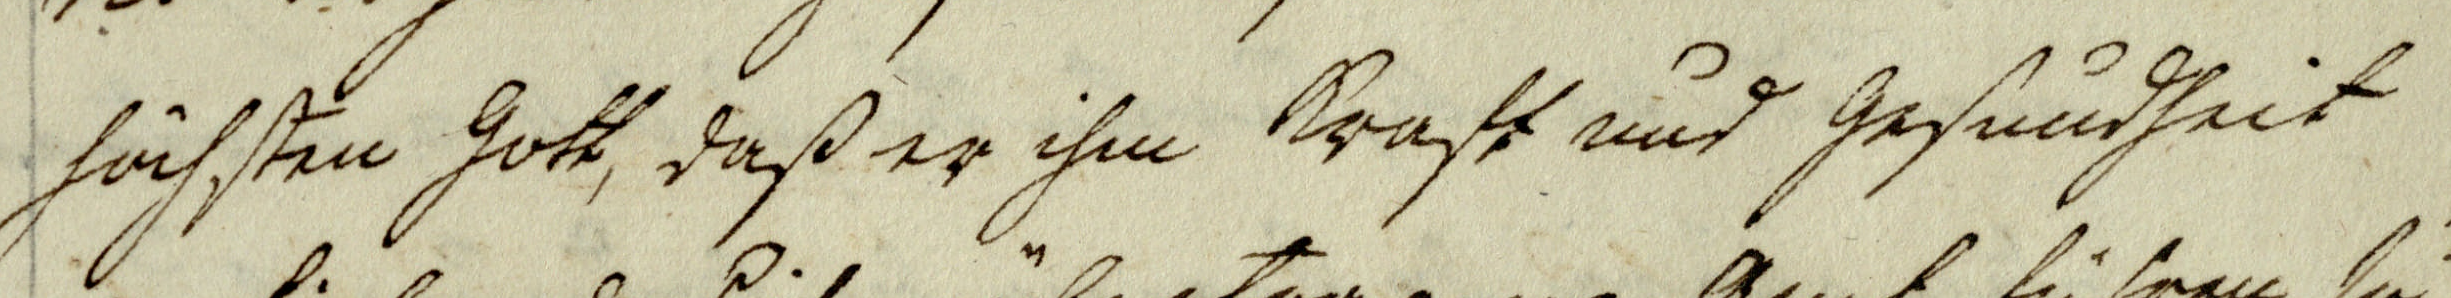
höchsten Gott, daß er ihm Kraft und Gesundheit
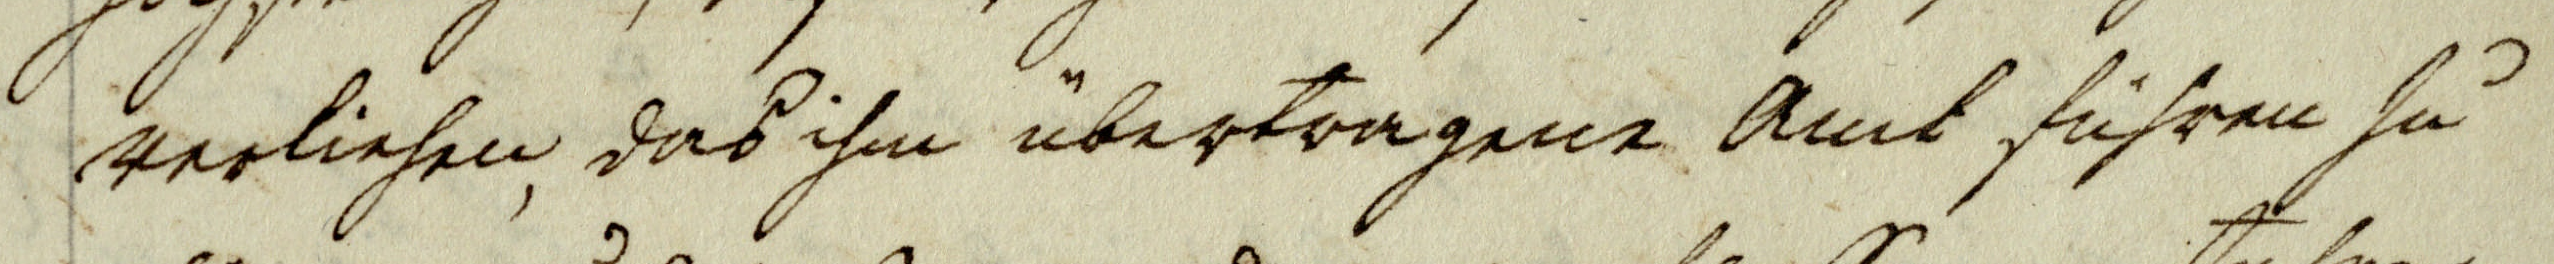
verliehen, das ihm übertragene Amt führen zu
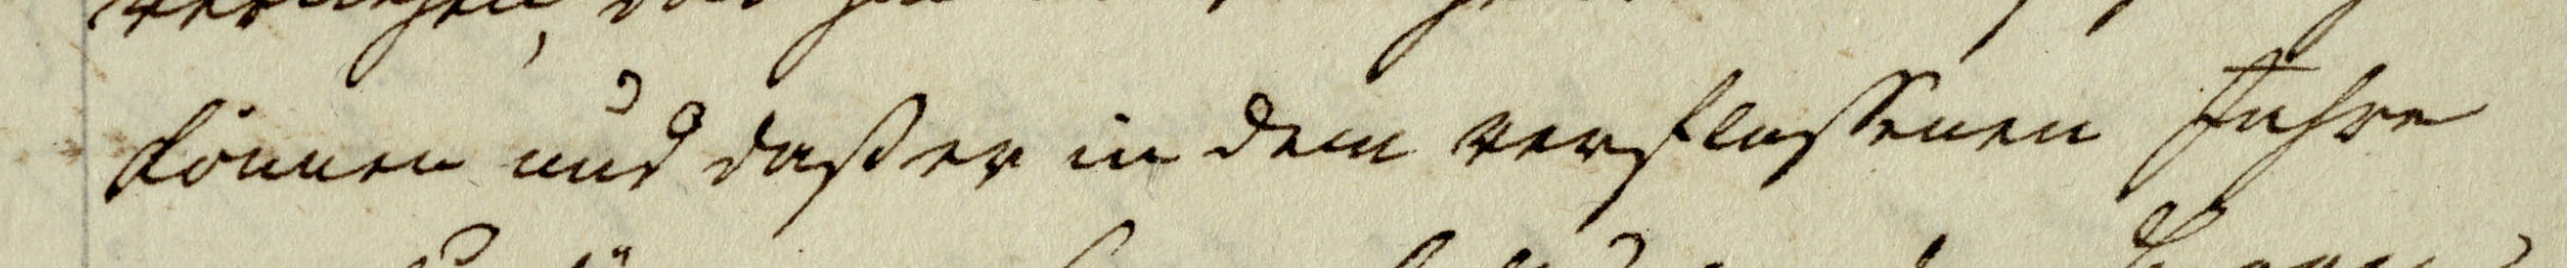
können und daß er in dem verflossenen Jahre
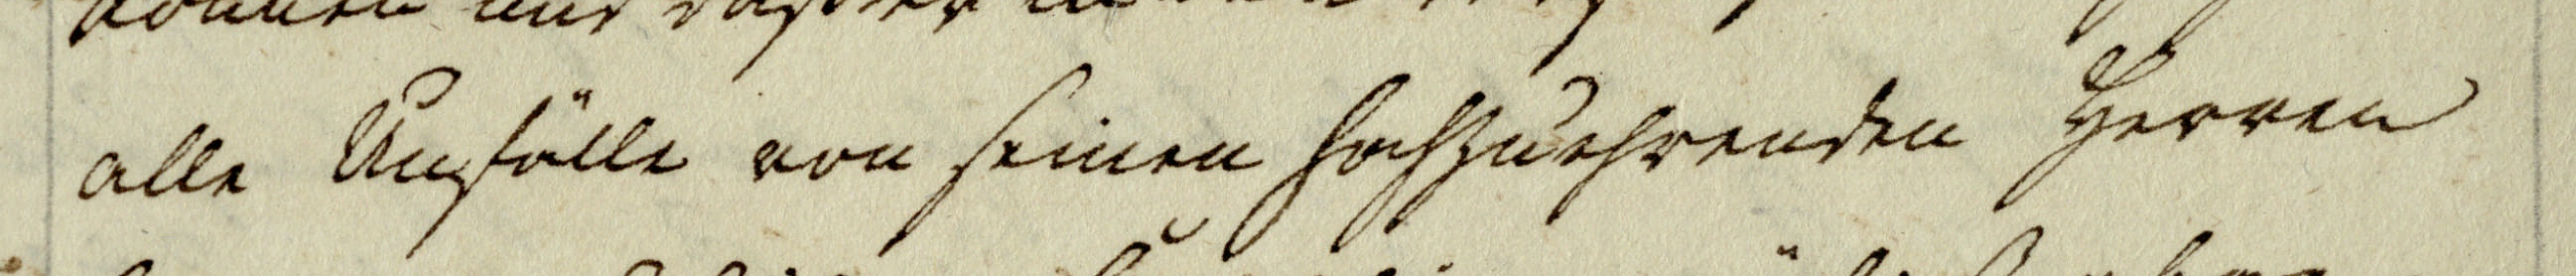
alle Unfälle von seinen hochzuehrenden Herren
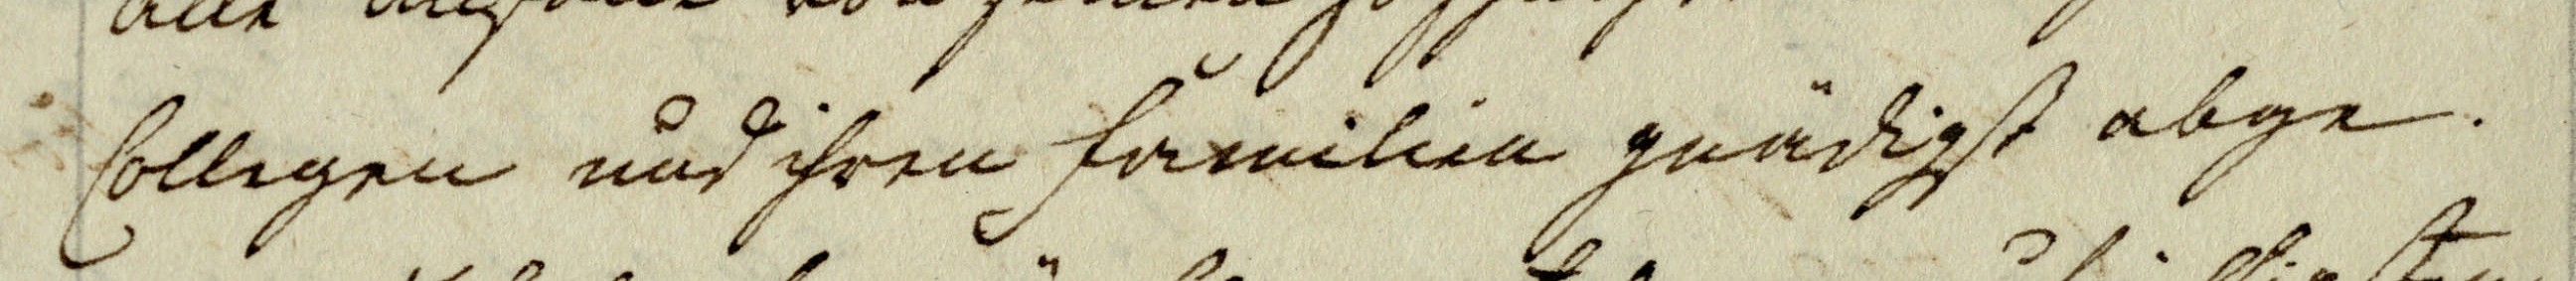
Collegen und ihren Familien gnädigst abge¬
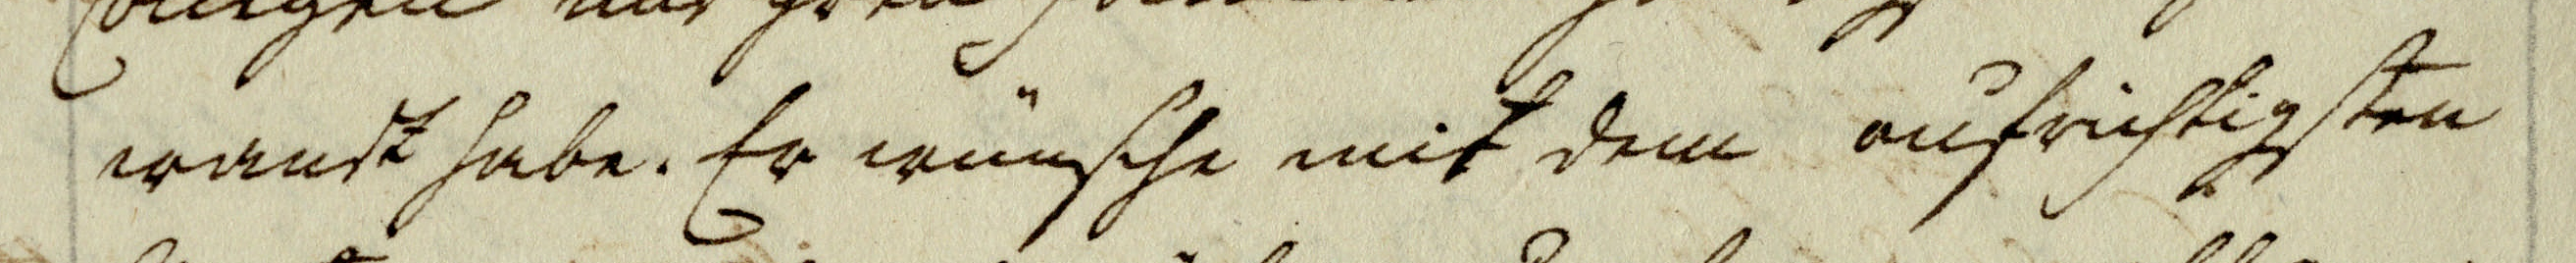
wandt habe. Er wünsche mit dem aufrichtigsten
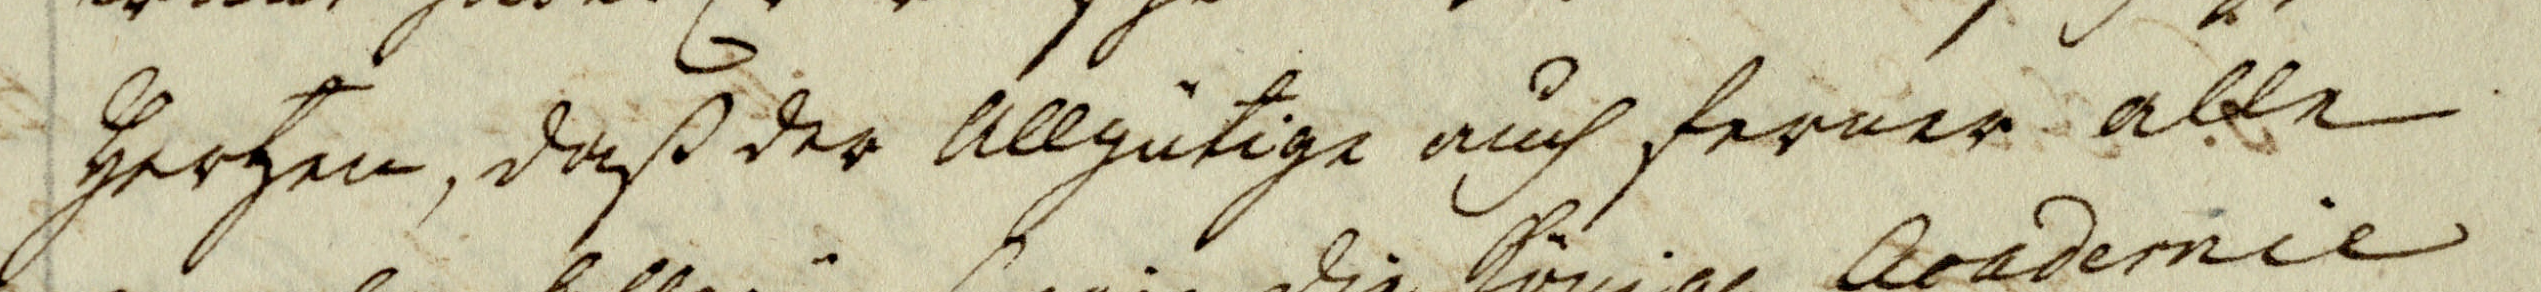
Herzen, daß der Allgütige auch ferner alle
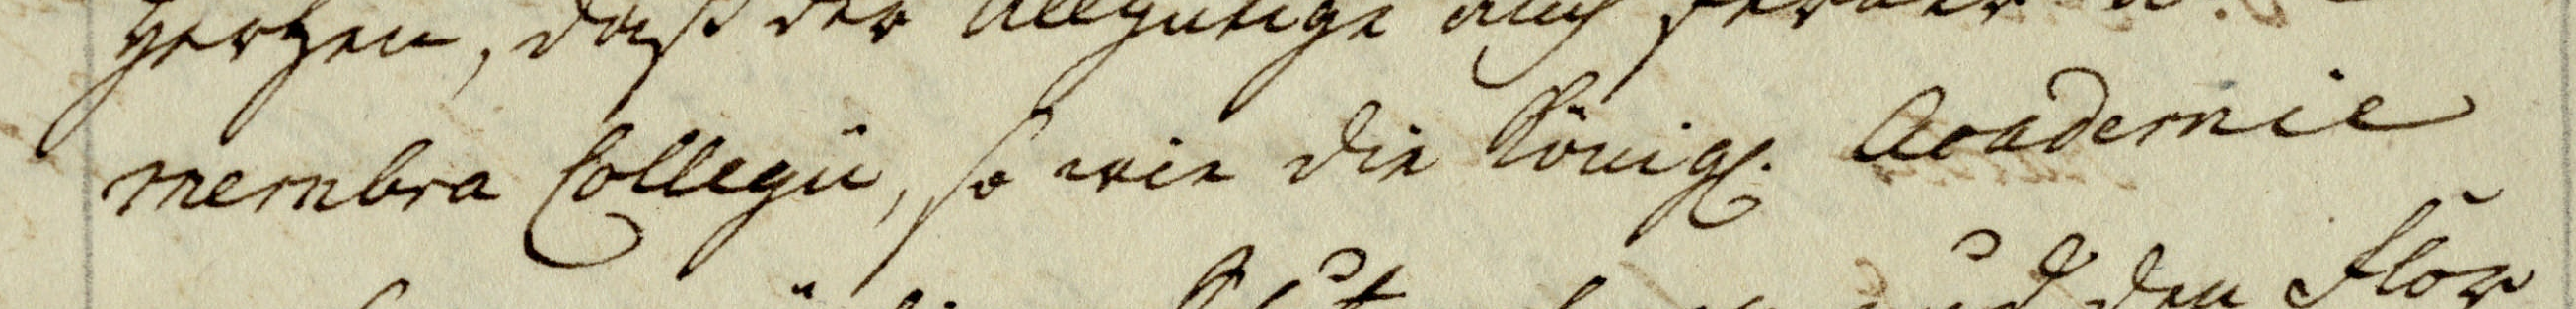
membra Collegii, so wie die Königl. Academie
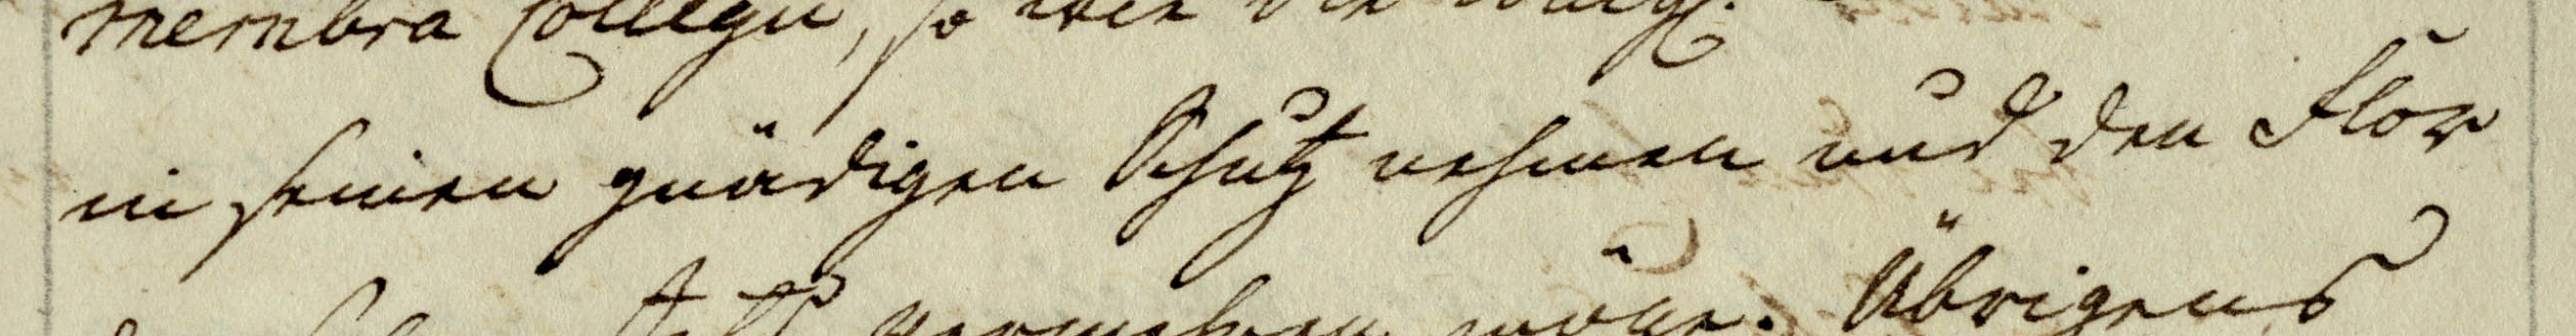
in seinen gnädigen Schutz nehmen und den Flor
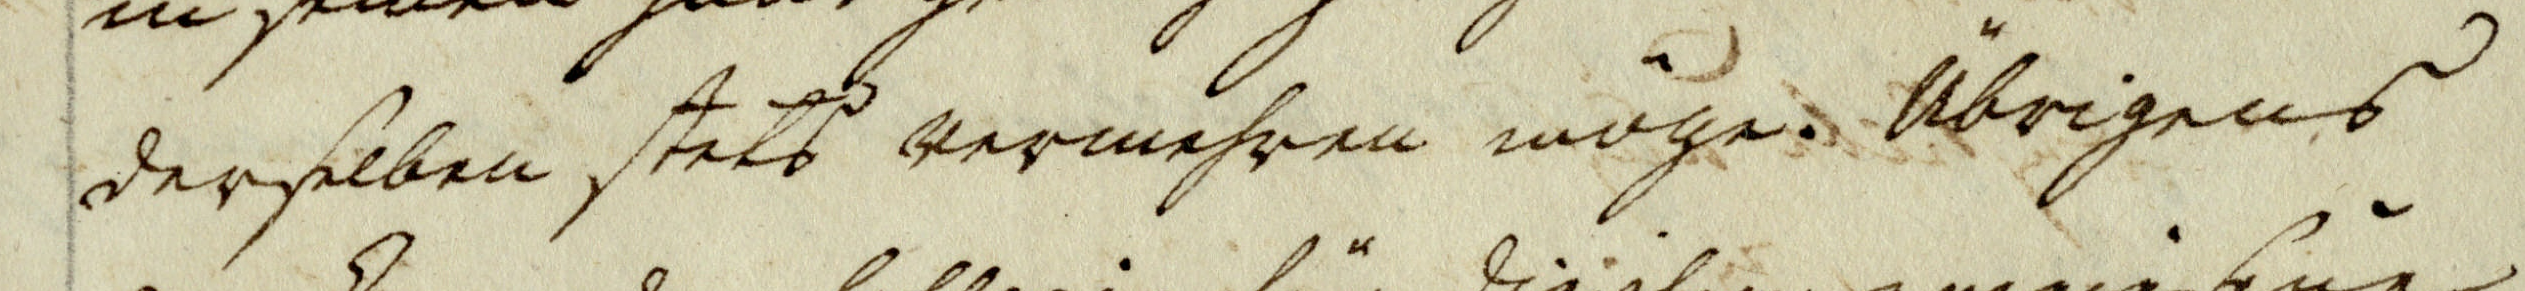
derselben stets vermehren möge. Übrigens
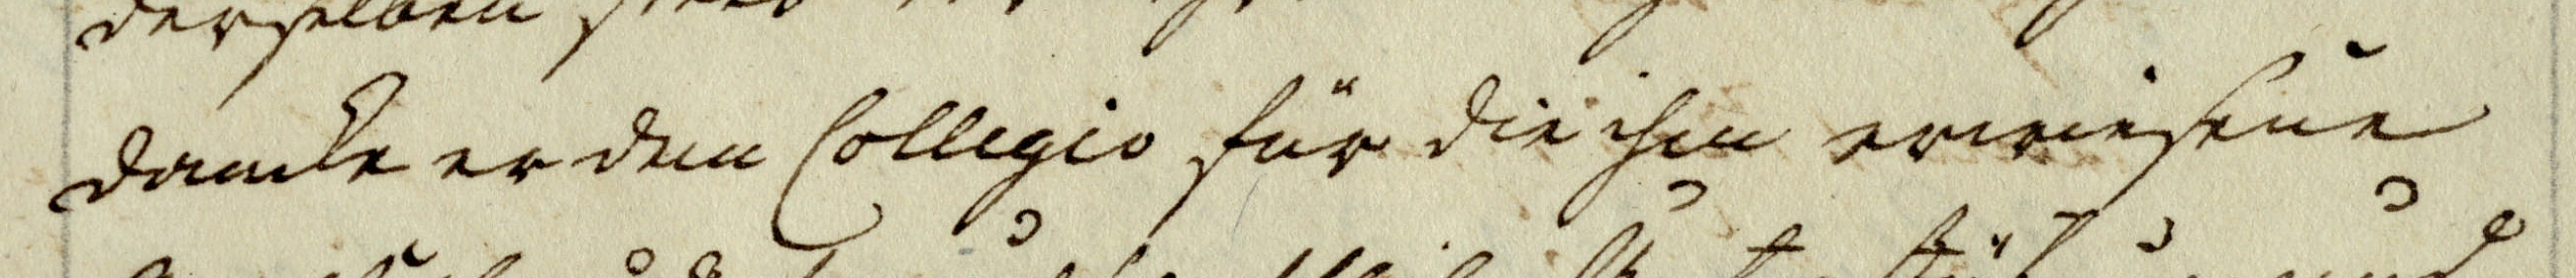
dancke er dem Collegio für die ihm erwiesene
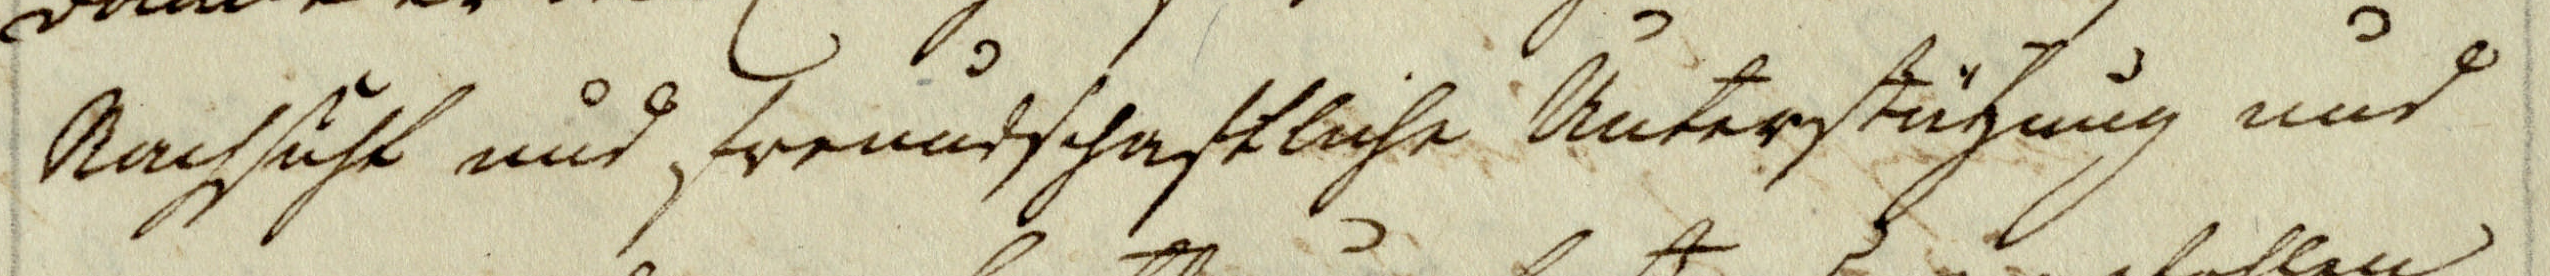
Nachsicht und freundschaftliche Unterstützung und
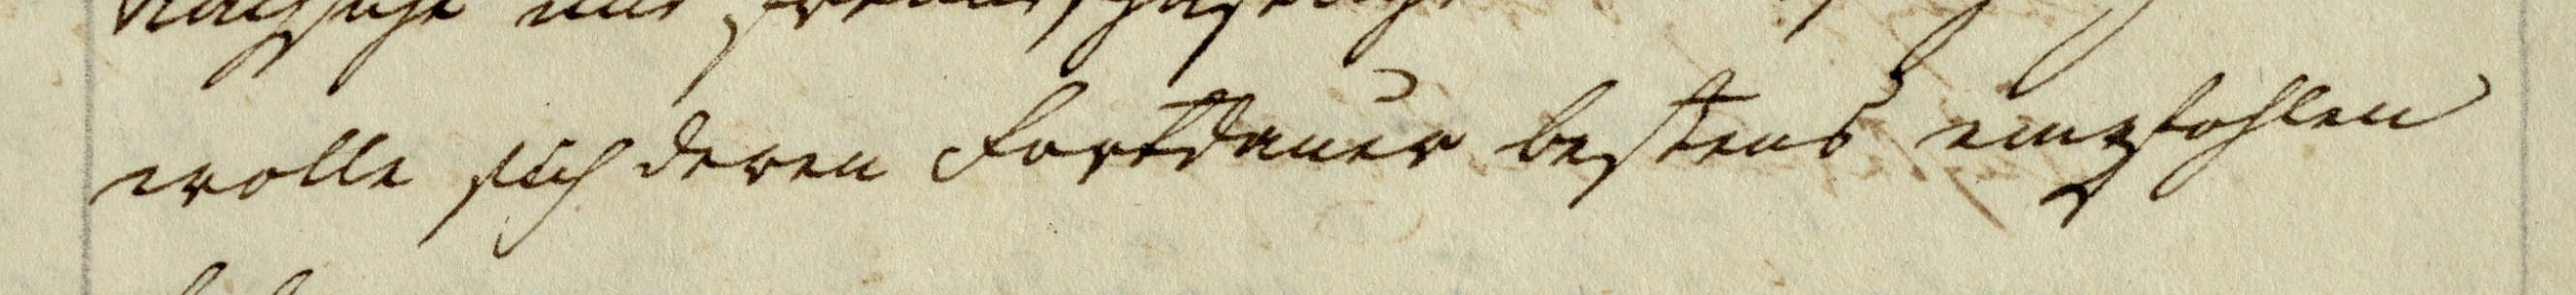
wolle sich deren Fortdauer bestens empfohlen
